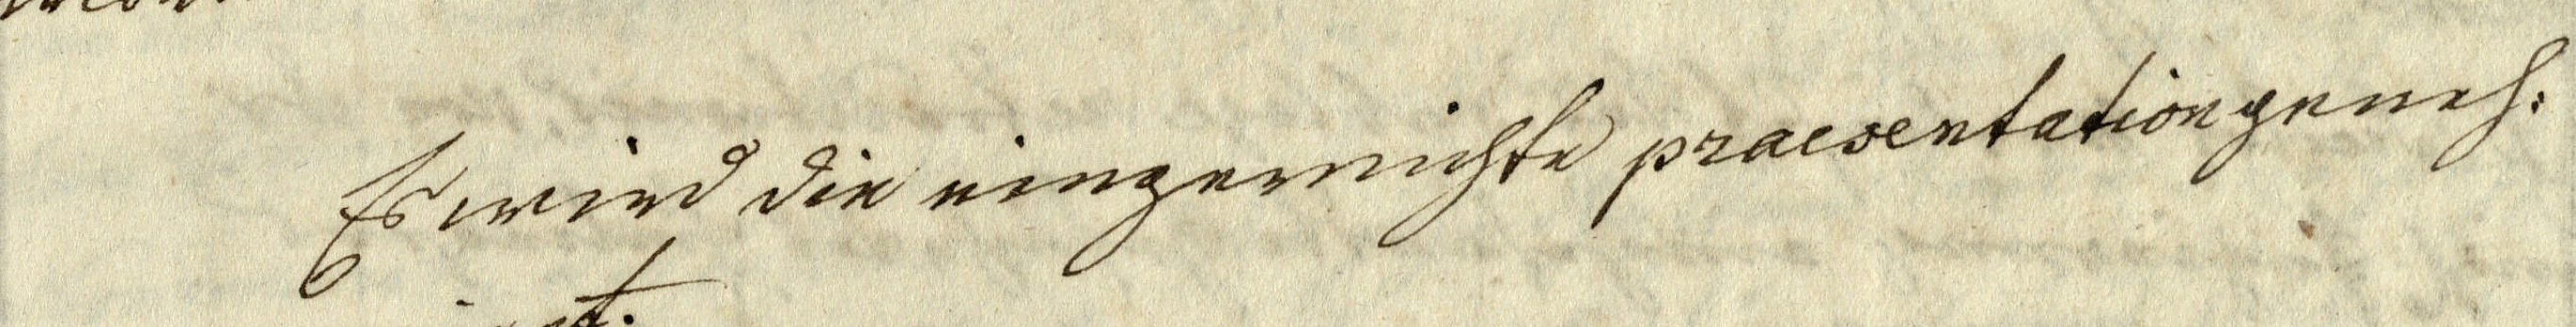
Es wird die eingereichte praesentation geneh¬
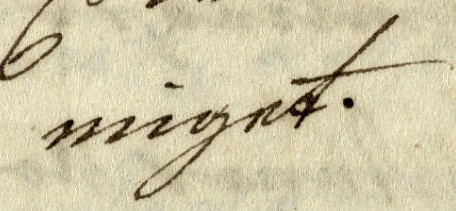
miget.
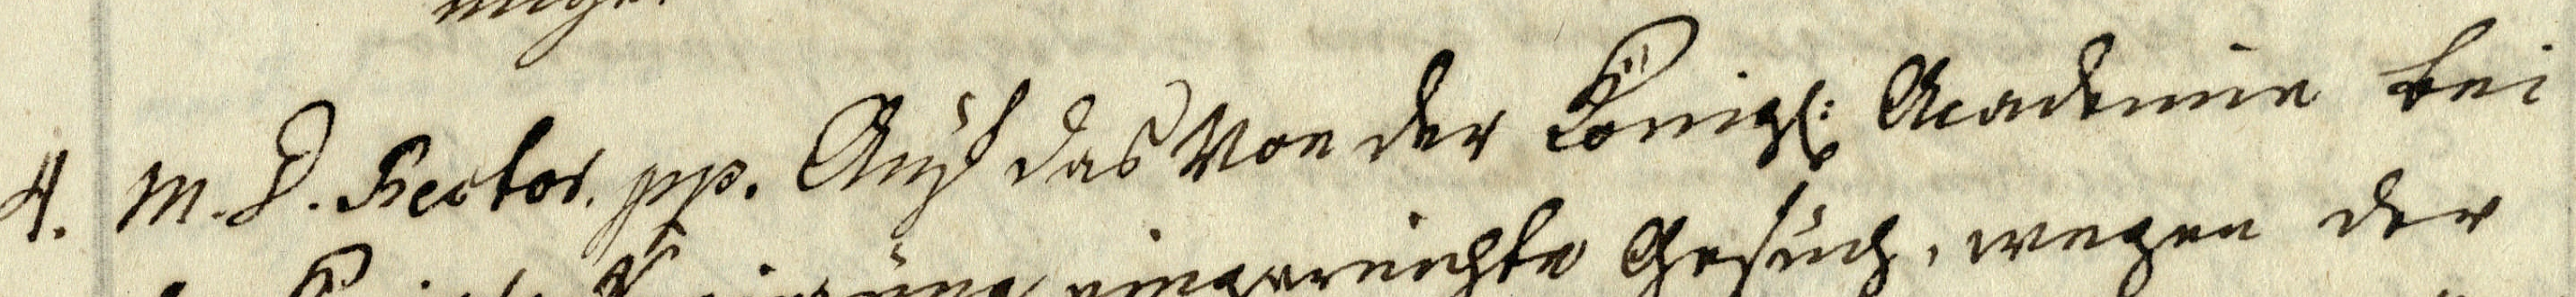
4. M. D. Rector.pp. Auf das von der Königl. Academie bei
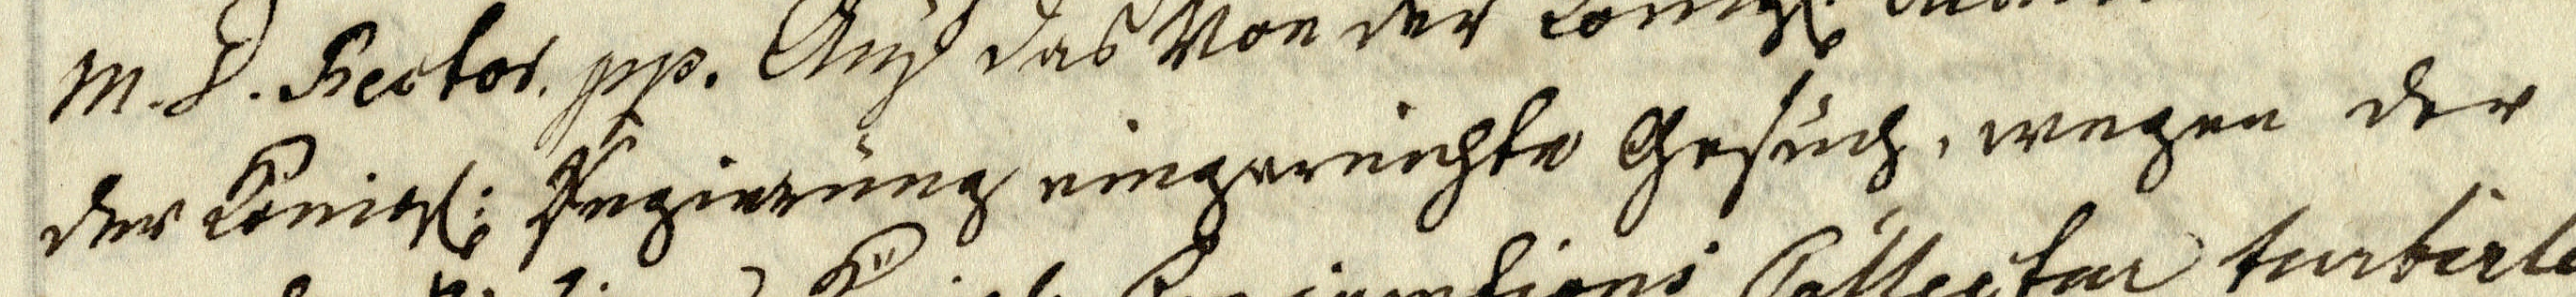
der Königl. Regierung eingereichte Gesuch, wegen der
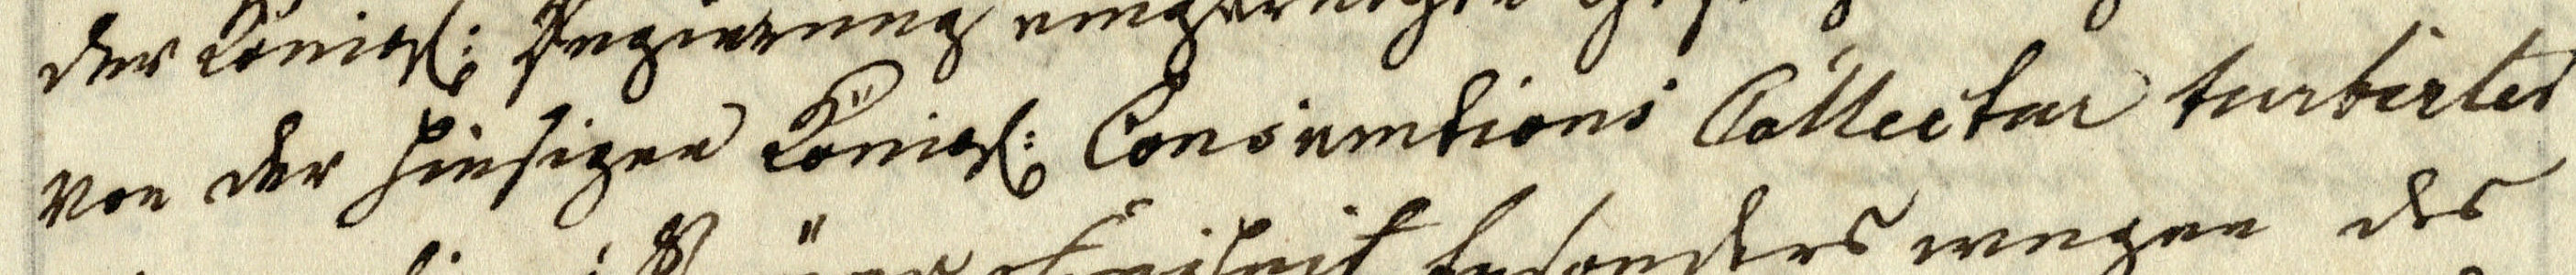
von der hiesigen Königl. Consumtions Collectur turbirter
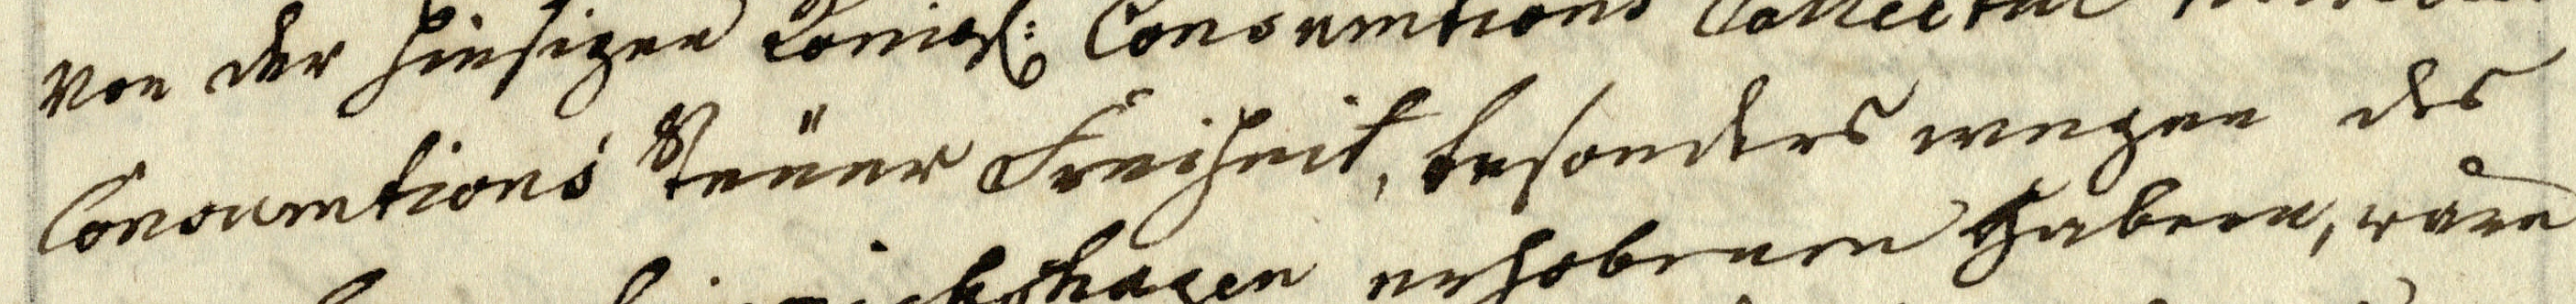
Consumtions Steuer Freiheit, besonders wegen des
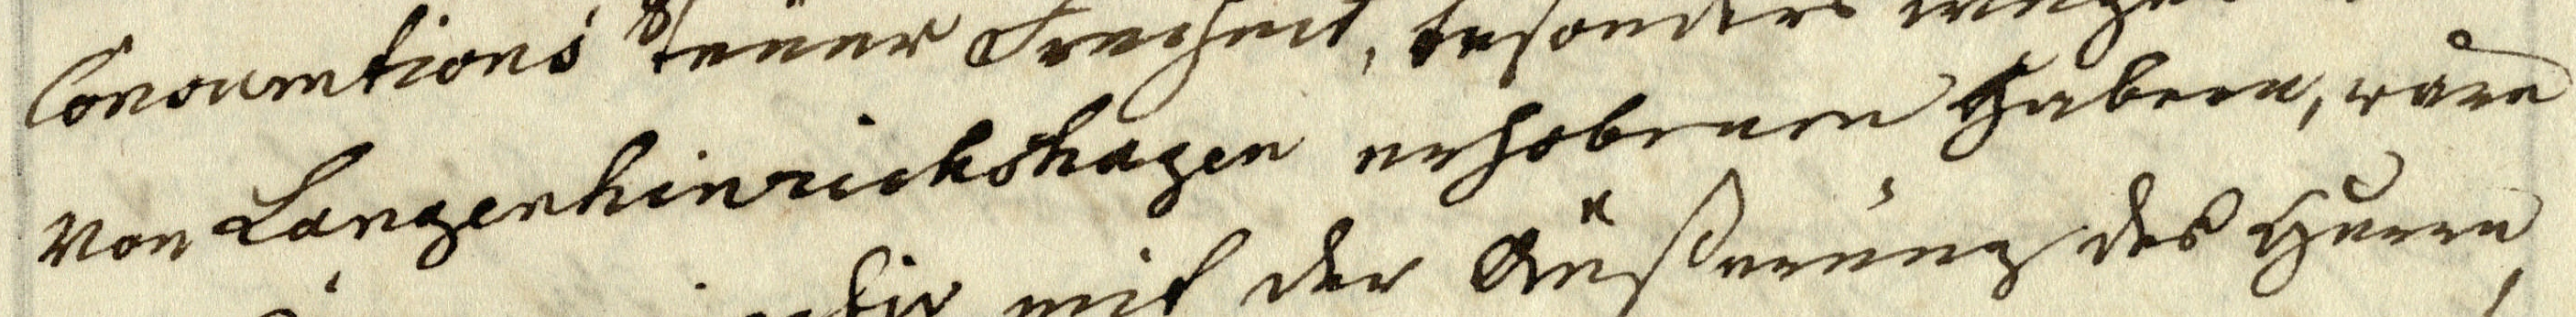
von Langenhinrichshagen erhobenen Habern, wäre
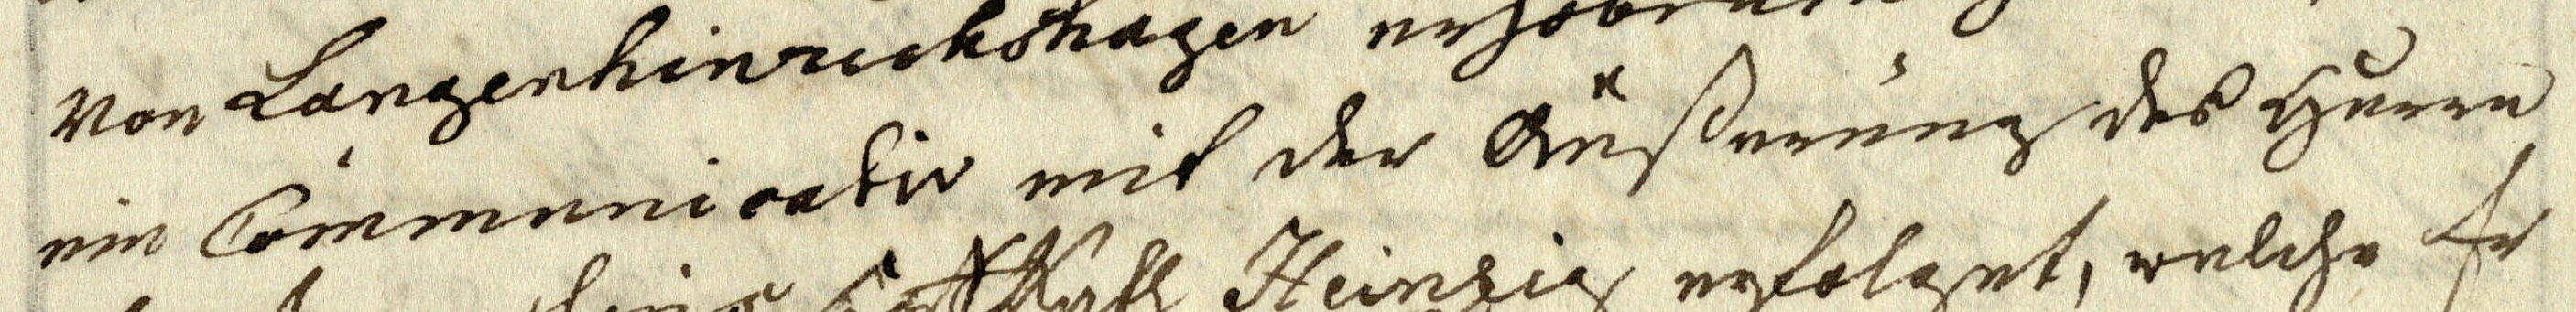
ein Communicativ mit der Äußerung des Herrn
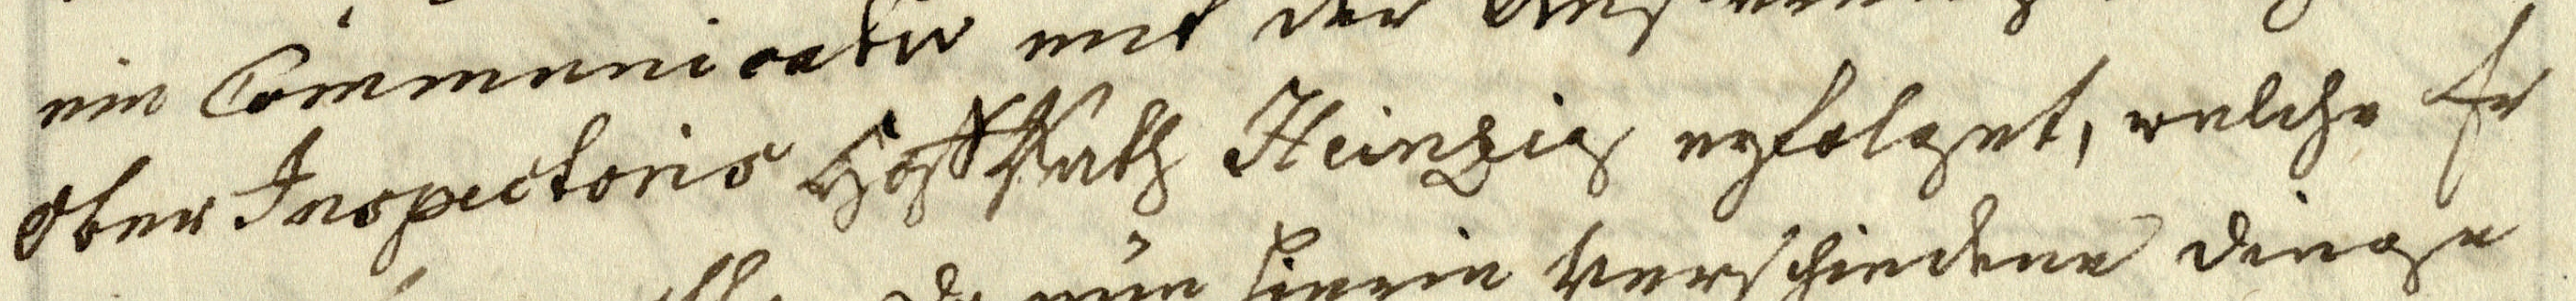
Ober Inspectoris HofRath Heinzig erfolget, welche Er
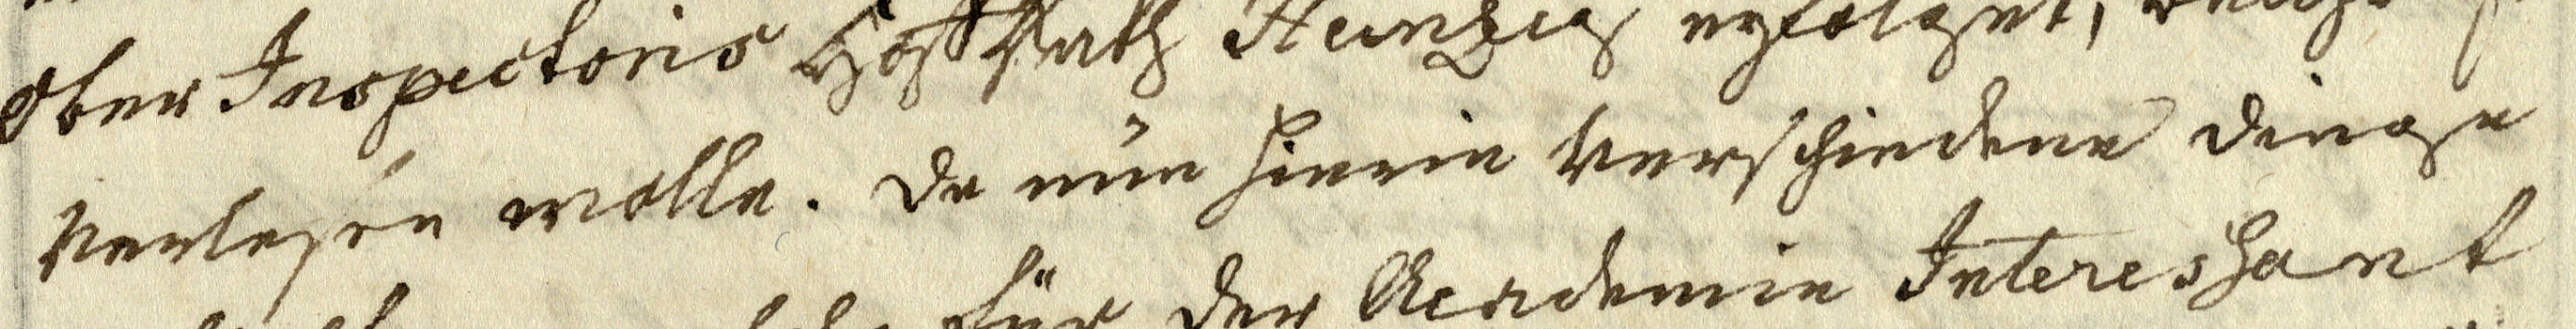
verlesen wolle. Da nun hierin verschiedene Dinge
